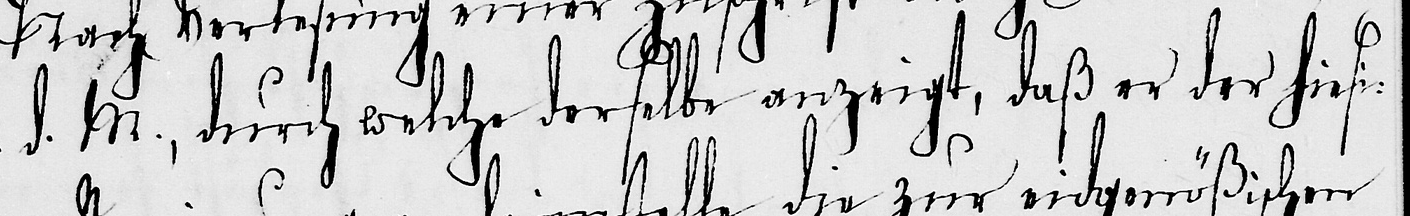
d. M., durch welche derselbe anzeigt, daß er hies¬
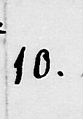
10.
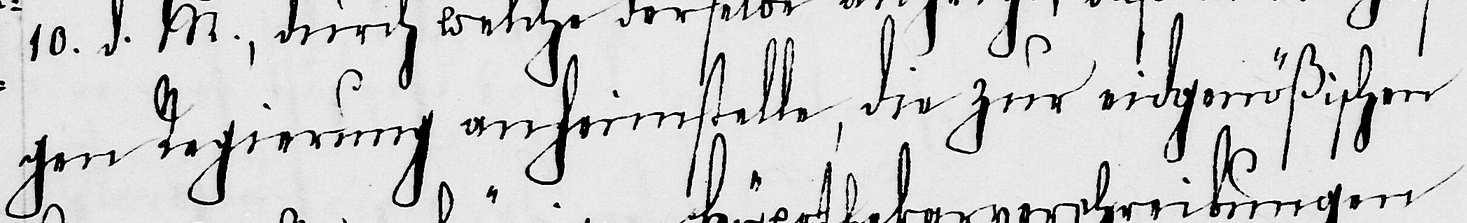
igen Regierung anheimstelle, die zur eidgenößischen
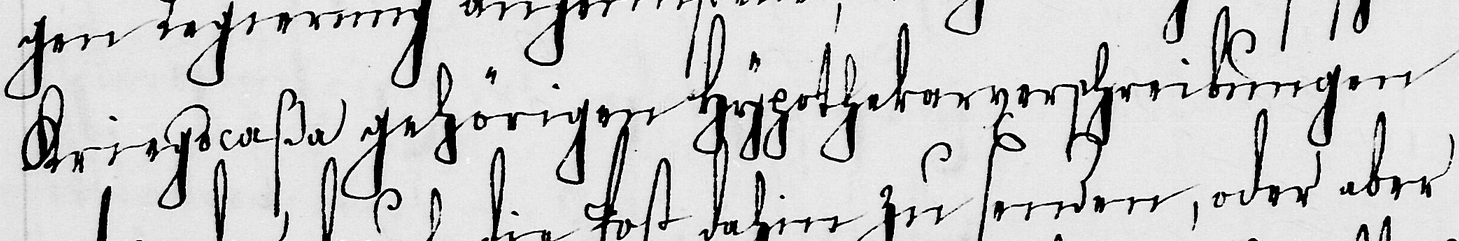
Kriegscaßa gehörigen Hypothekarverschreibungen
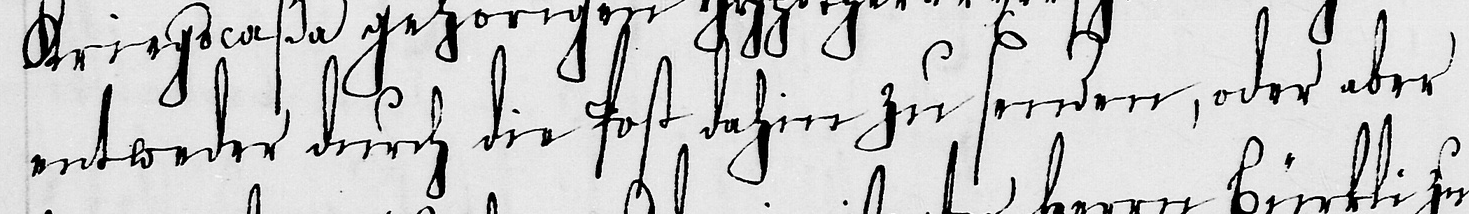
entweder durch die Post dahin zu senden, oder aber
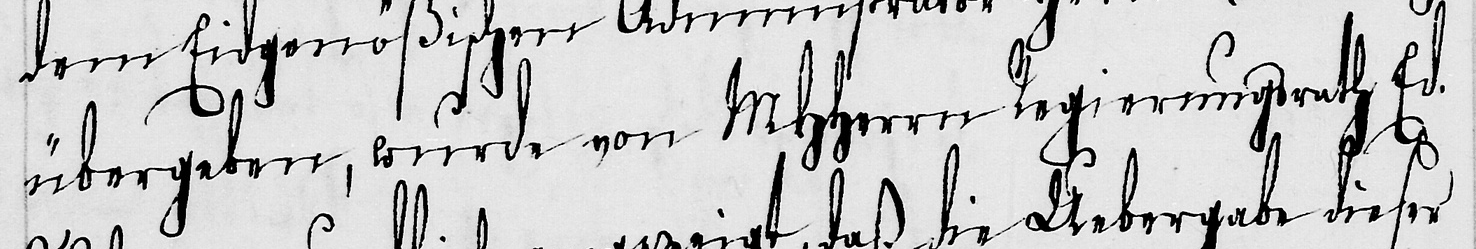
übergeben, wurde von MHHerrn Regierungsrath Ed.
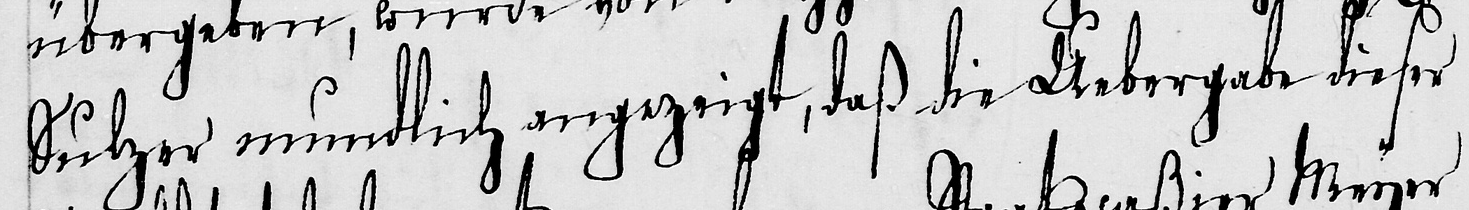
Sulzer mündlich angezeigt, daß die Uebergabe dieser
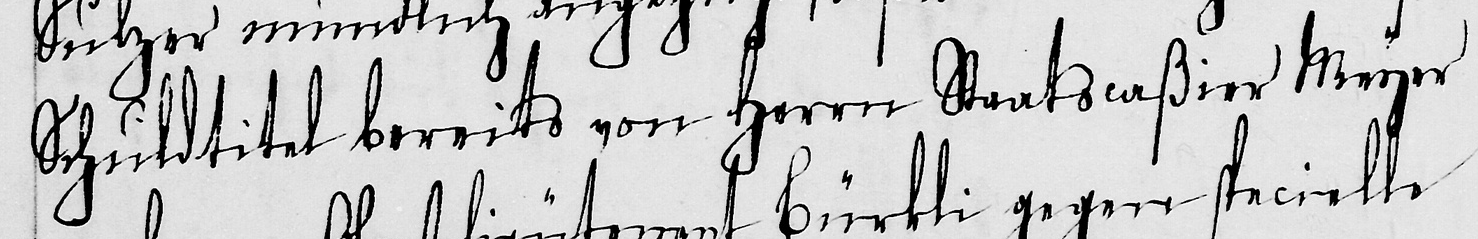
Schuldtitel bereits von Herrn Staatscaßier Meyer
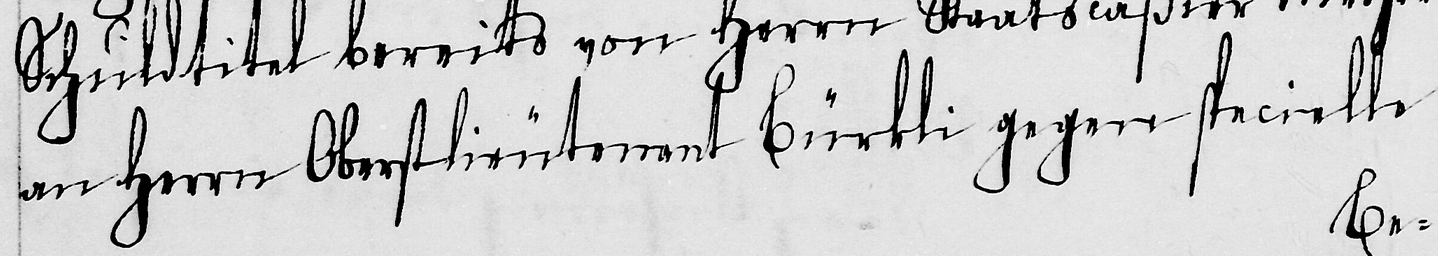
an Herrn Oberstlieutenant Bürkli gegen specielle
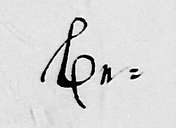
Be-
